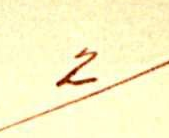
2
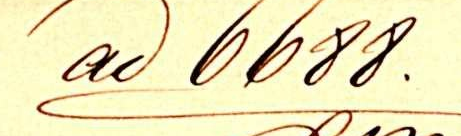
ad 6688/
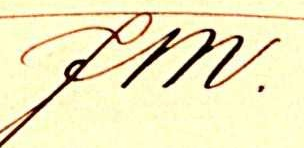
JM
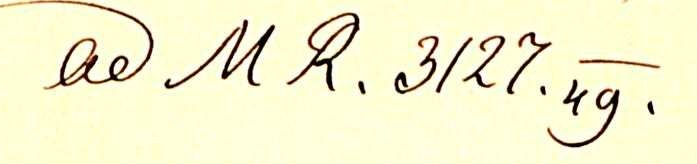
ad MR 3127/49
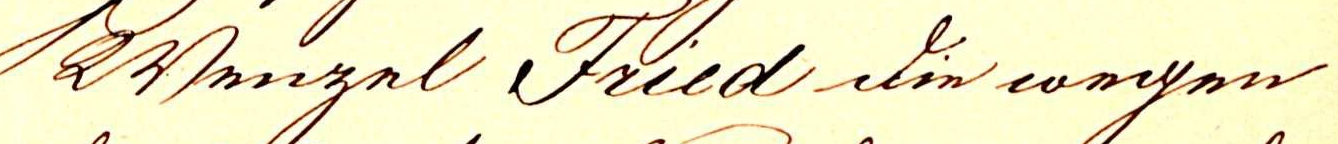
Wenzel Fried die, wegen
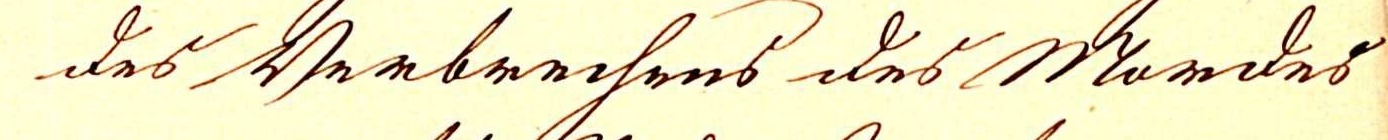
des Verbrechens des Mordes
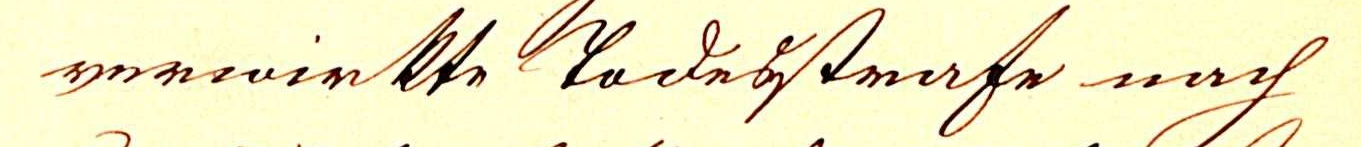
verwirkte Todesstrafe nach
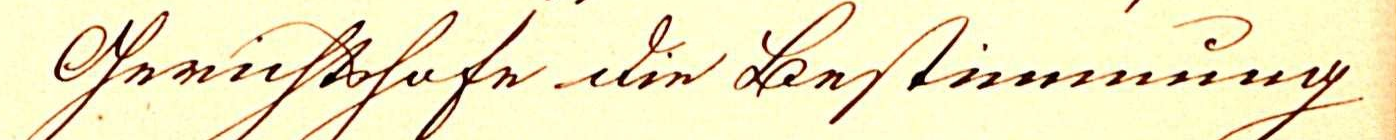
Gerichtshofe die Bestimmung
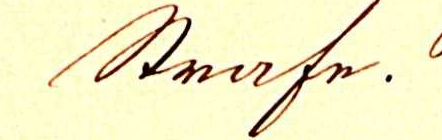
Strafe.
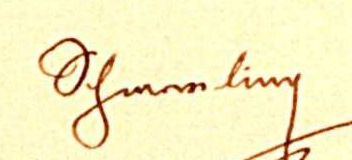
Schmerling
